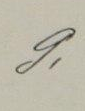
g.
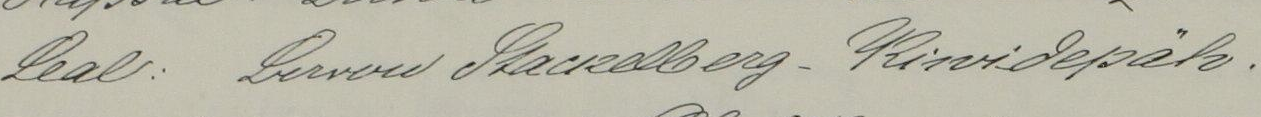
Leal: Baron Stackelberg-Kiwidepäh.
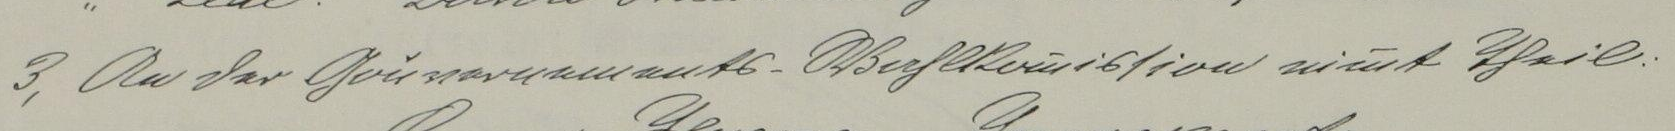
3. An der Gouvernements-Wahlkommission nimmt Theil
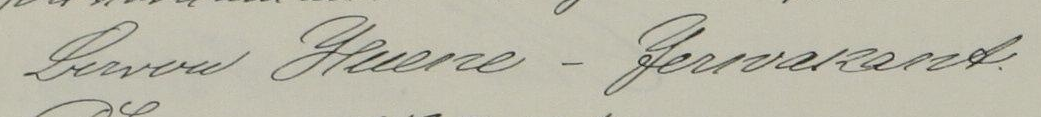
Baron Huene-Jerwakant.
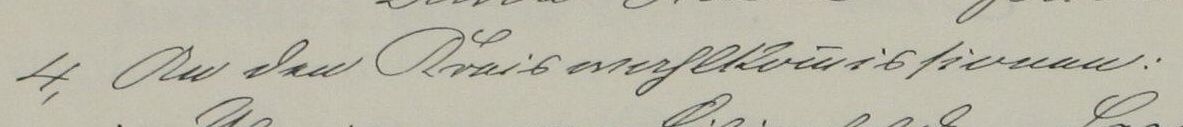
4. An den Kreiskommissionen:
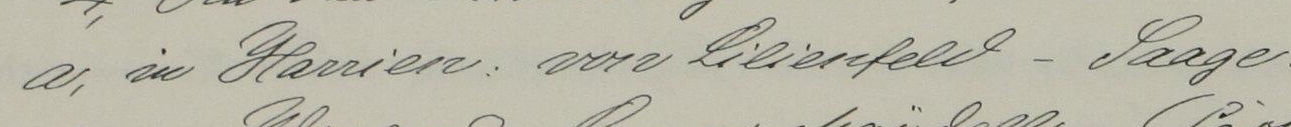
a. in Harrien: von Lilienfeld-Saage.
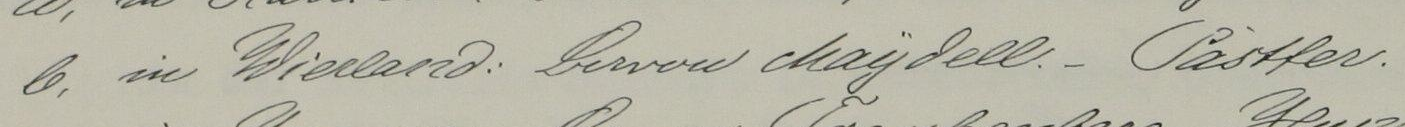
b. in Wierland: Baron Maydell-Pastfer.
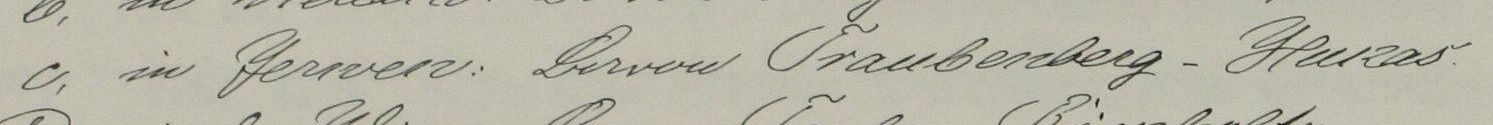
c. in Jerwen: Baron Traubenberg-Hukas.
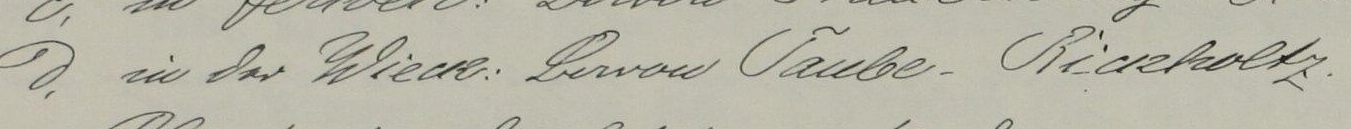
d. in der Wieck: Baron Taube-Rickholtz.
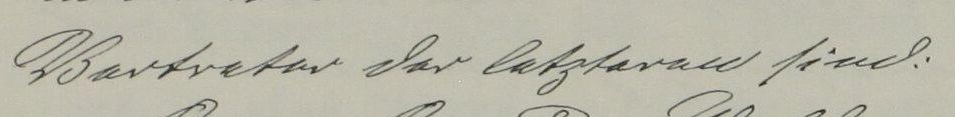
Vertreter der letzteren sind:
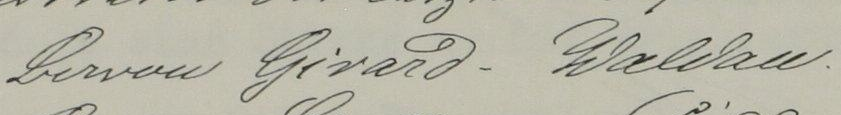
Baron Girard-Waldau.
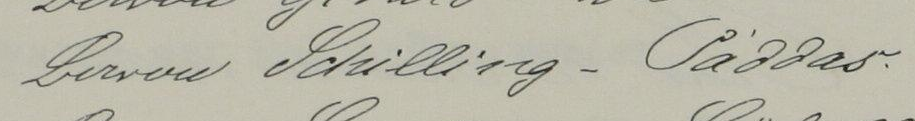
Baron Schilling-Paddas.
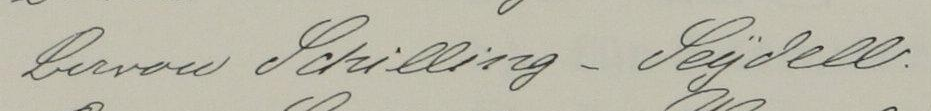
Baron Schilling-Seydell.
